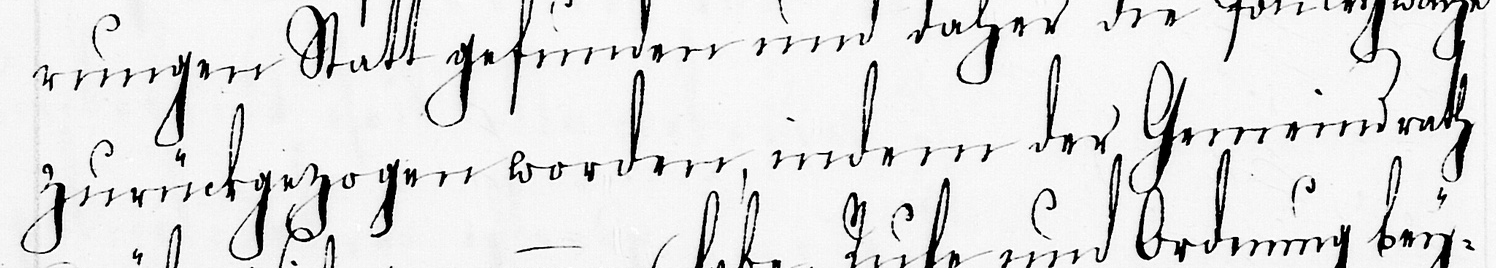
zurückgezogen worden, indem der Gemeindrath
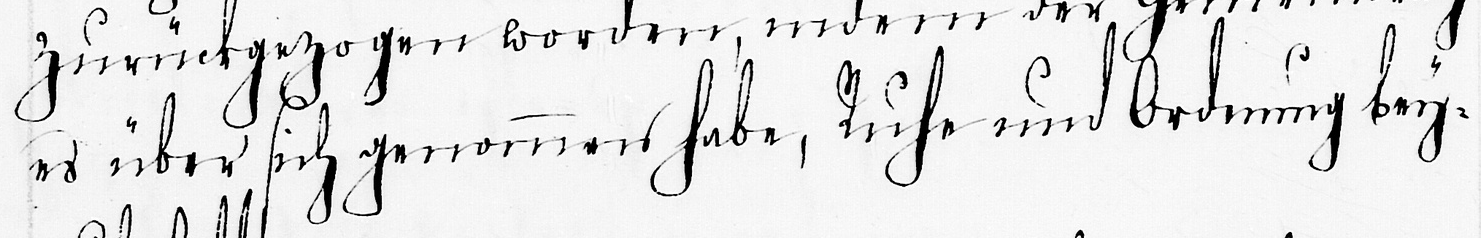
es über sich genommen habe, Ruhe und Ordnung bey¬
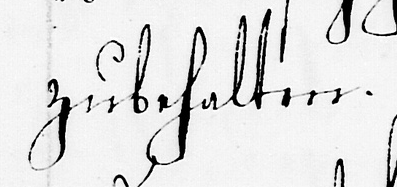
zubehalten.
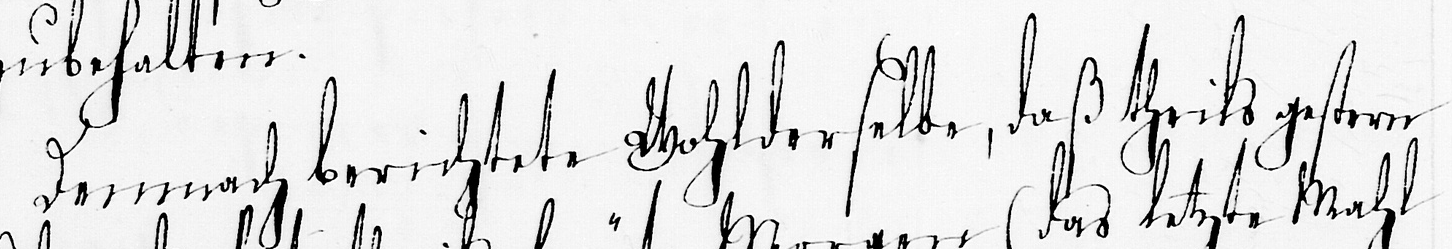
Demnach berichtete Wohlderselbe, daß theils ge¬
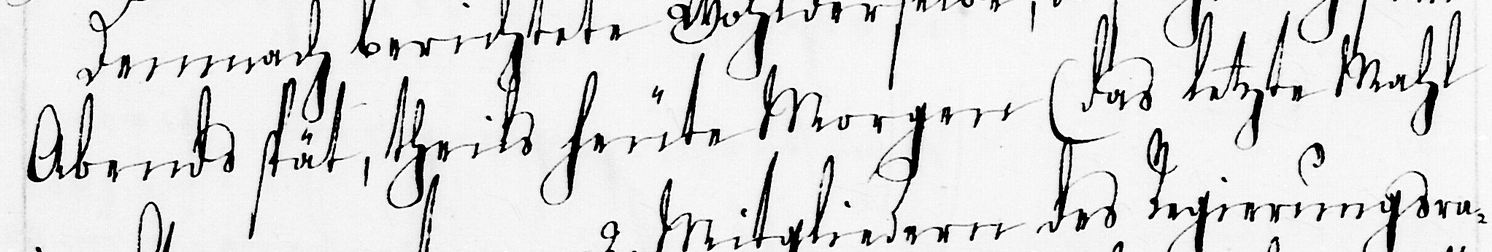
Abends spät, theils heute Morgen (das letzte Mahl
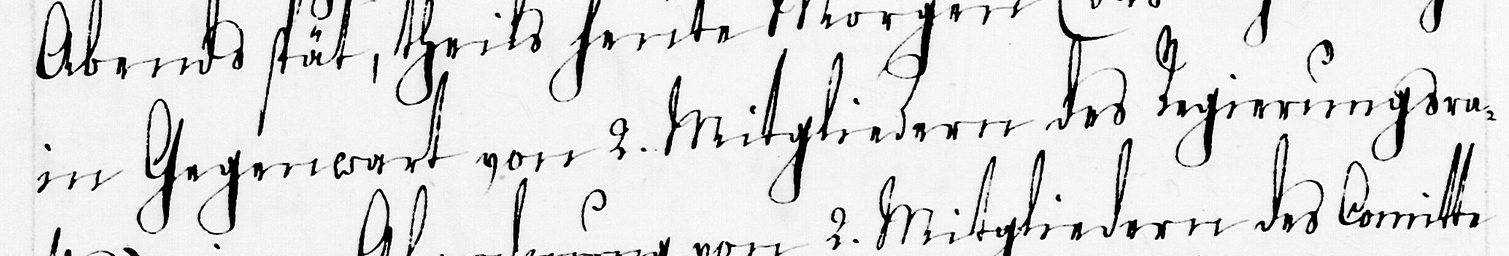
in Gegenwart von 2. Mitgliedern des Regierungsra¬
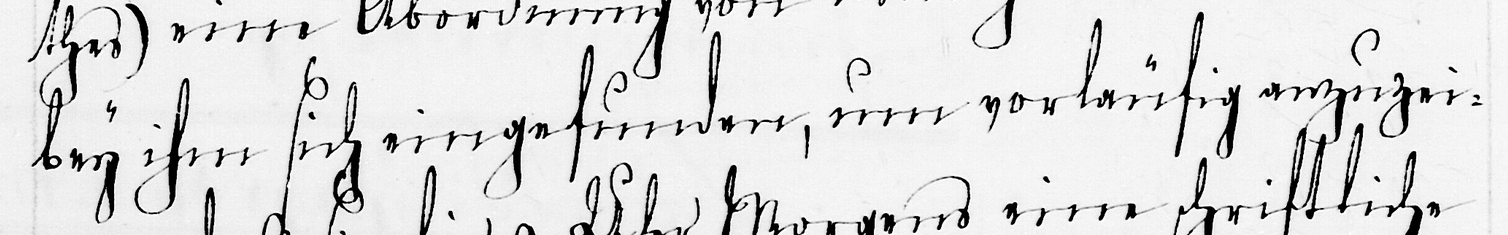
bey ihm sich eingefunden, um vorläufig anzuzei¬
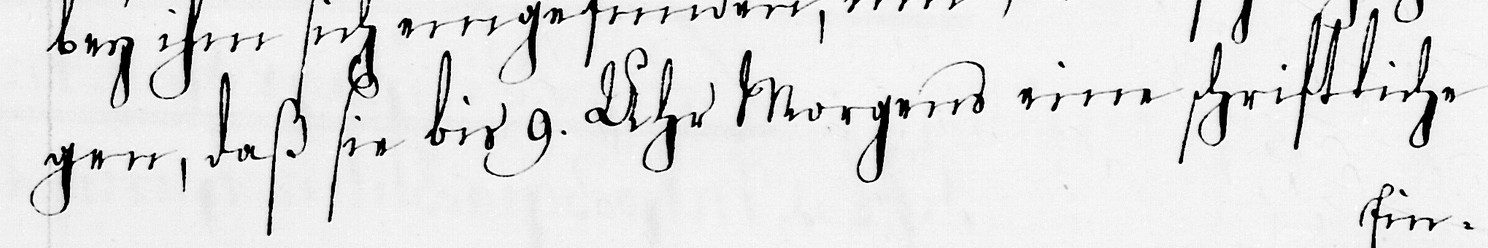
gen, daß sie bis 9. Uhr Morgens eine schriftliche
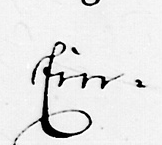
Ein-
